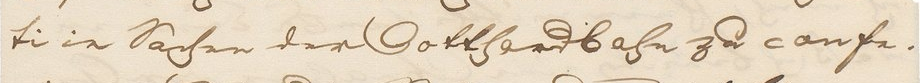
ti in Sachen der Gotthardbahn zu confe-
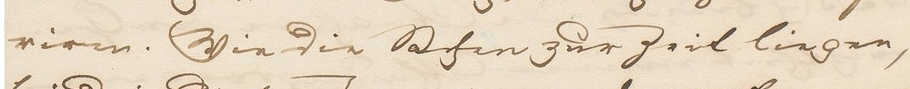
riren. Wie die Sachen zur Zeit liegen,
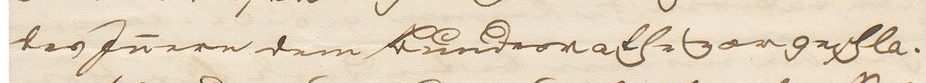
des Innern dem Bundesrathe vorgeschla-
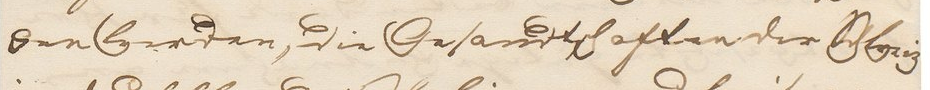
gen werden, die Gesandtschaften der Schweiz
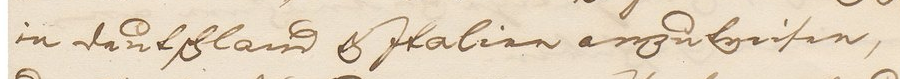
in Deutschland & Italien auszuweiten,
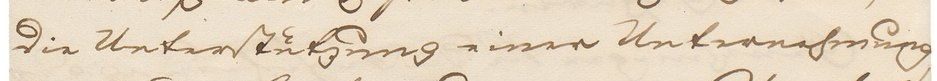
die Unterstützung einer Unternehmung,
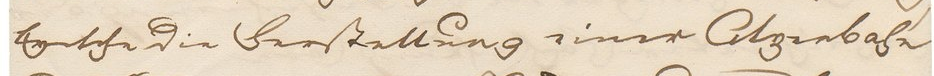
welche die Herstellung einer Alpenbahn
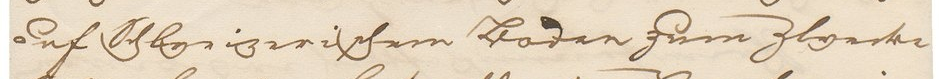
auf Schweizerischem Boden zum Zwecke
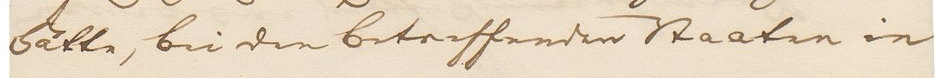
hätte, bei den betreffenden Staaten in
